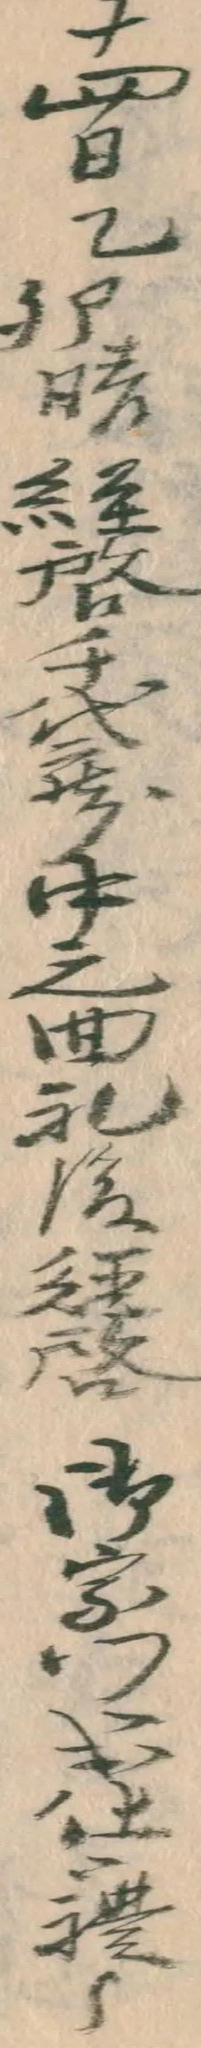十四日乙卯晴経啓千代蔵中元回礼後経啓御家門へ出仕御礼申
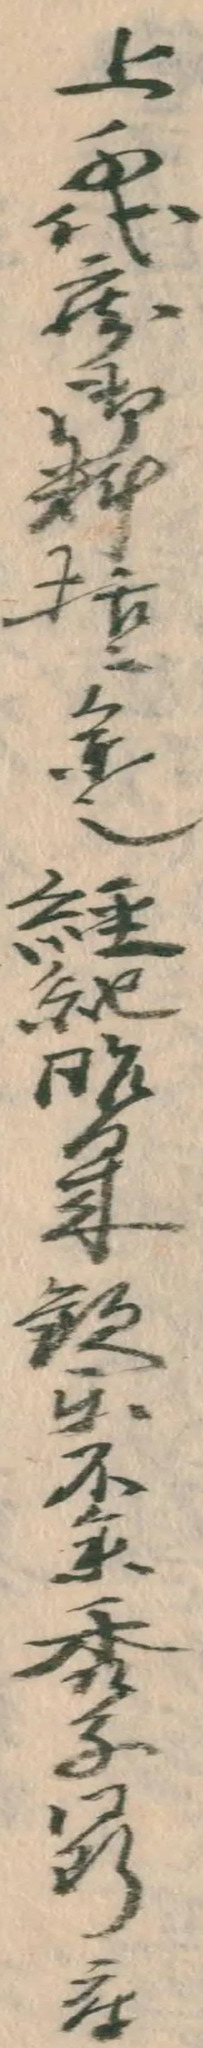上千代蔵御料括二参也経紀昨日来観楽不参秀子同断ニ付
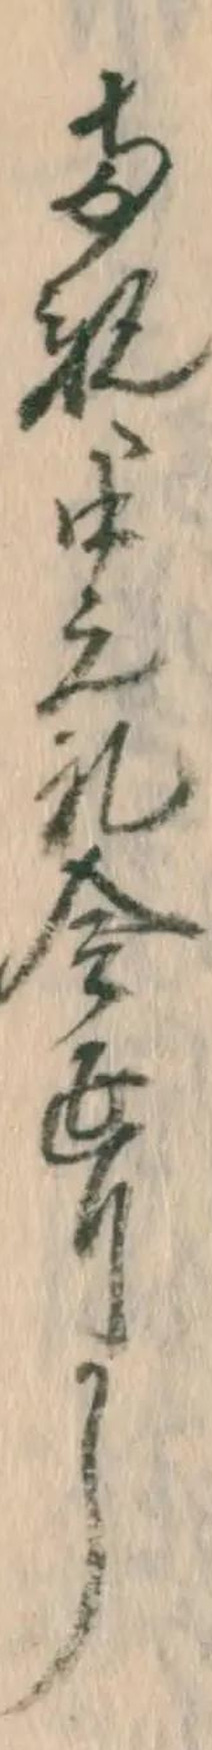両親へ中元礼令延引了
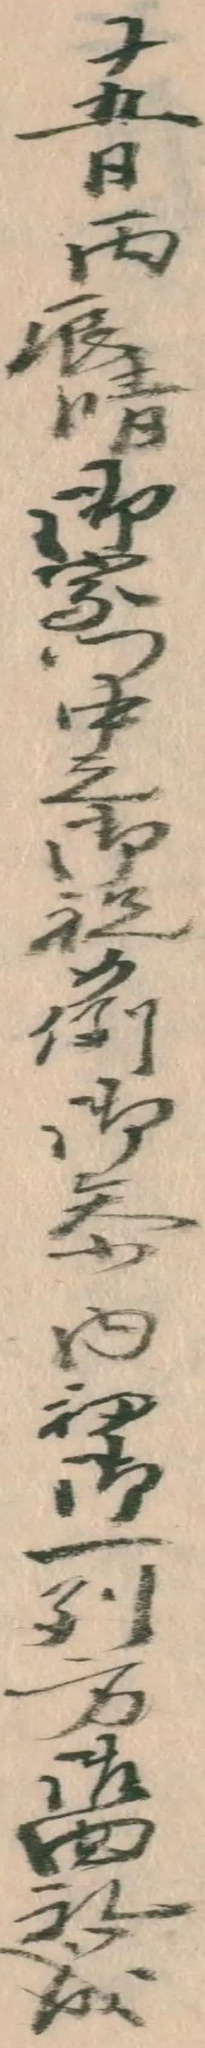十五日丙辰晴御家門中之御祝如例御参内初御一列方御回礼御成
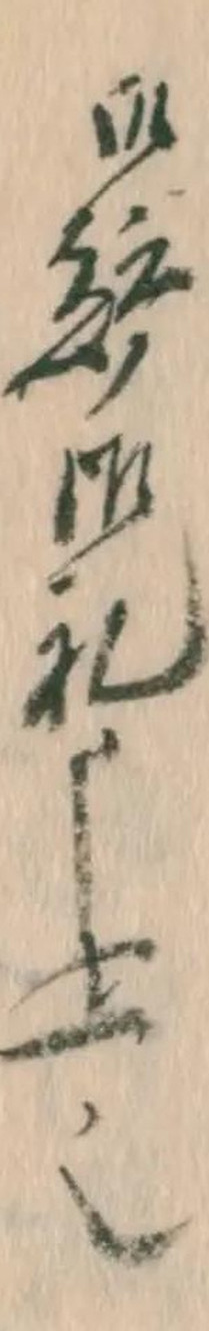御統御礼申上也
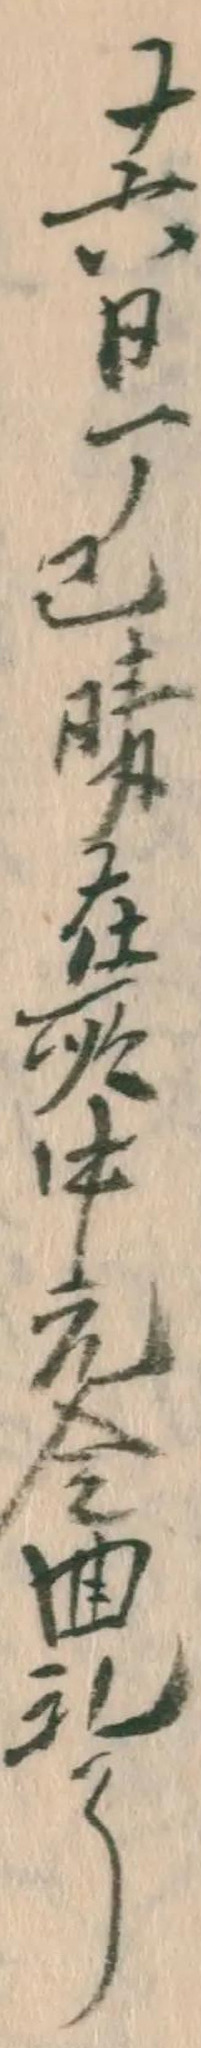十六日丁巳晴在所中元令回礼了
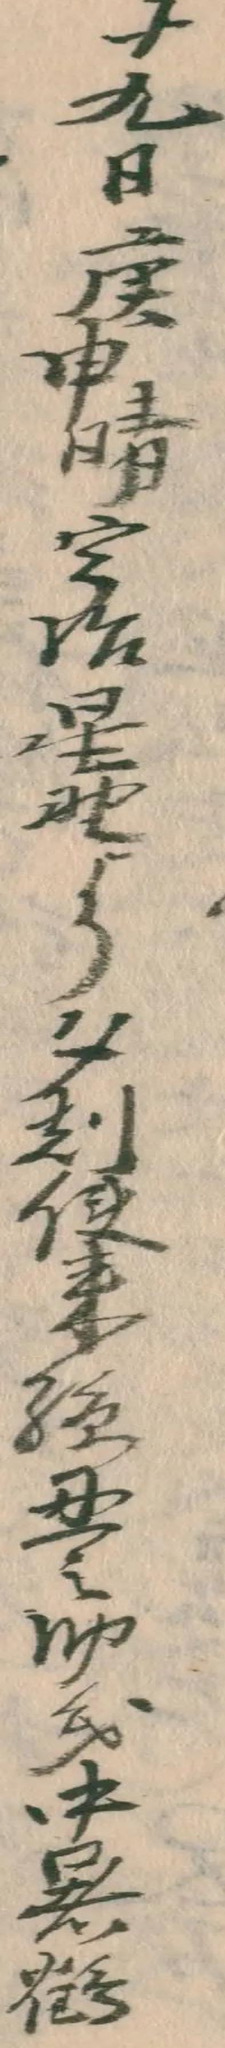十九日庚申晴宇治星野より夕刻使来孫丑之助義中暑鶴
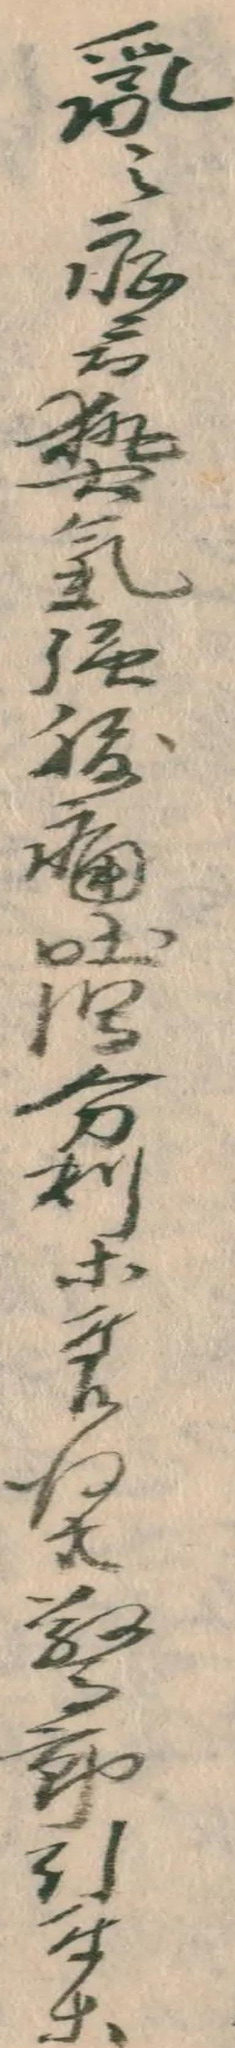乳之病ニ而熱気強腹痛吐瀉分利等付候得共驚動引付等
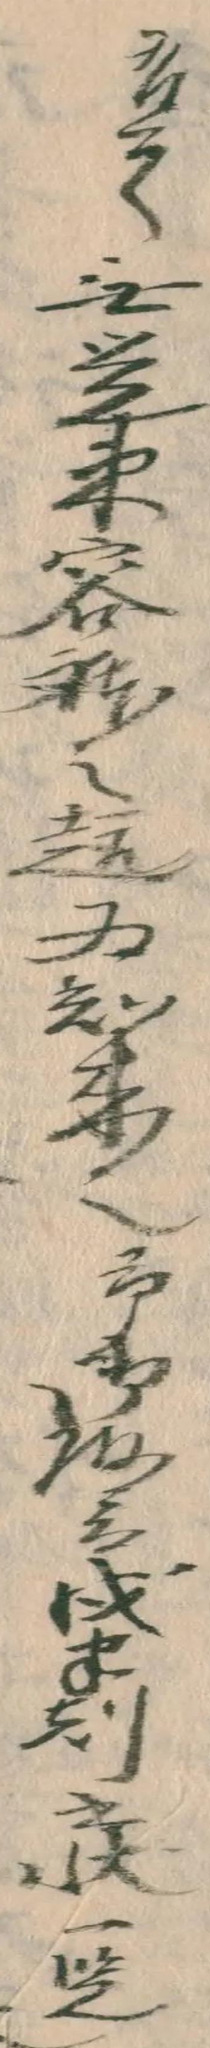有之無是束容躰之趣為知来也予御殿ニ而戌半之状一覧也
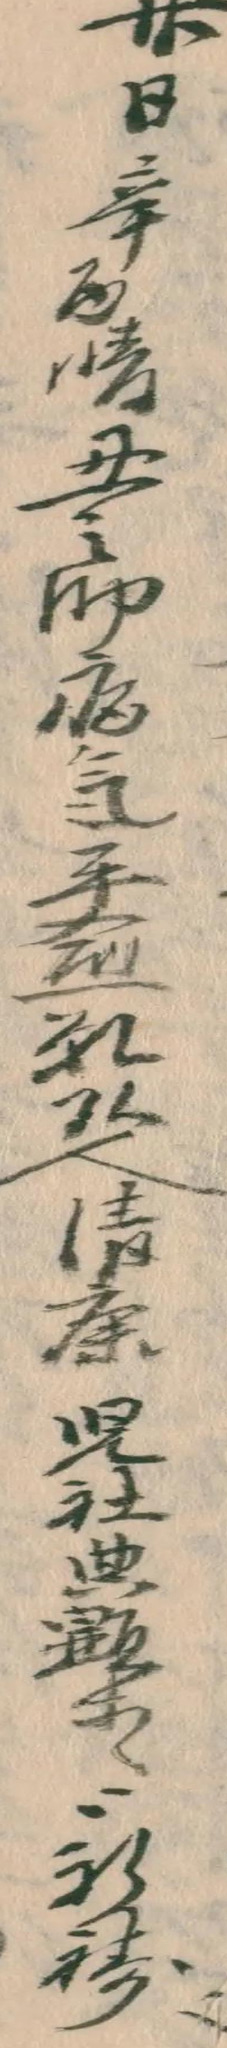廿日辛酉晴丑之助病気平癒願頭人清康児社典顕等へ御祈祷
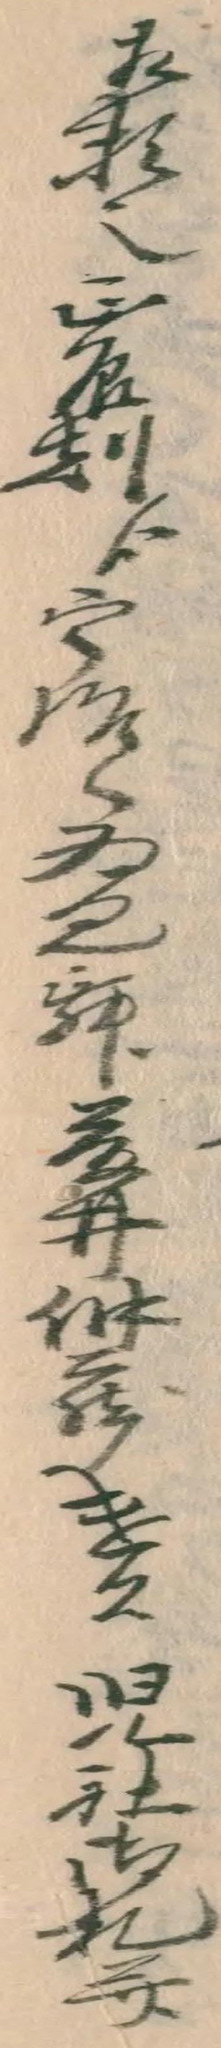相頼也正辰刻ゟ宇治へ為見舞藤井仲蔵遣ス児社御礼幷
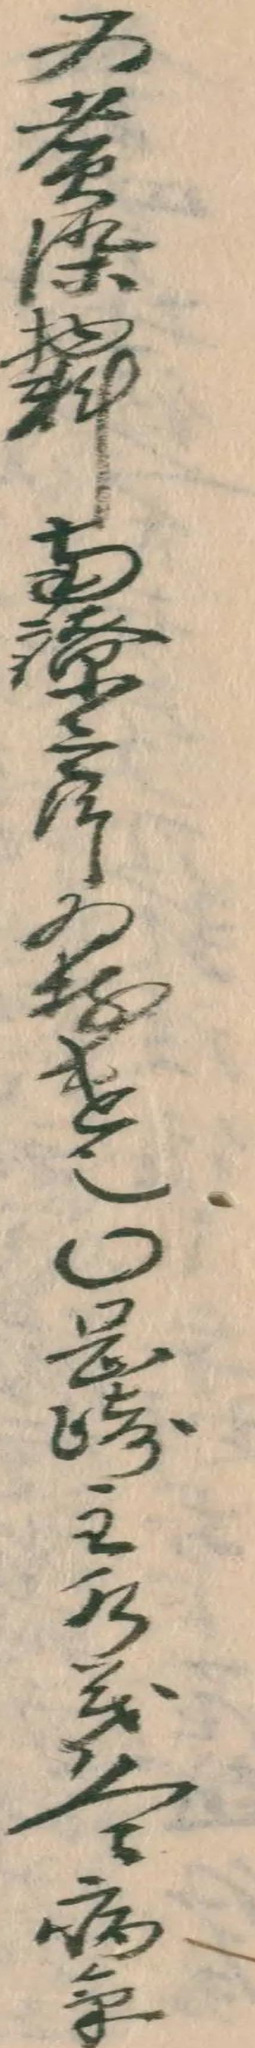為煮染物料南鐐壱片為持遣也○岡崎主水義久々病気
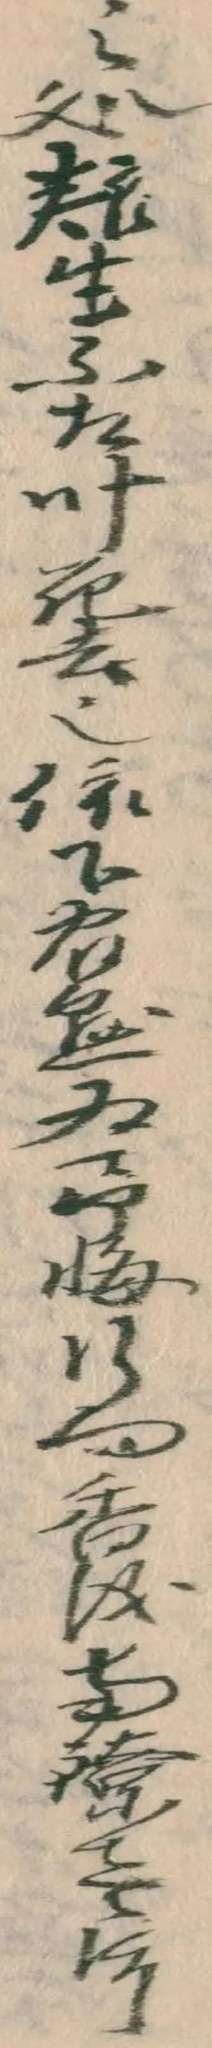之処養生不相叶死去也依下宿懸為弔悔行向香儀南鐐壱片
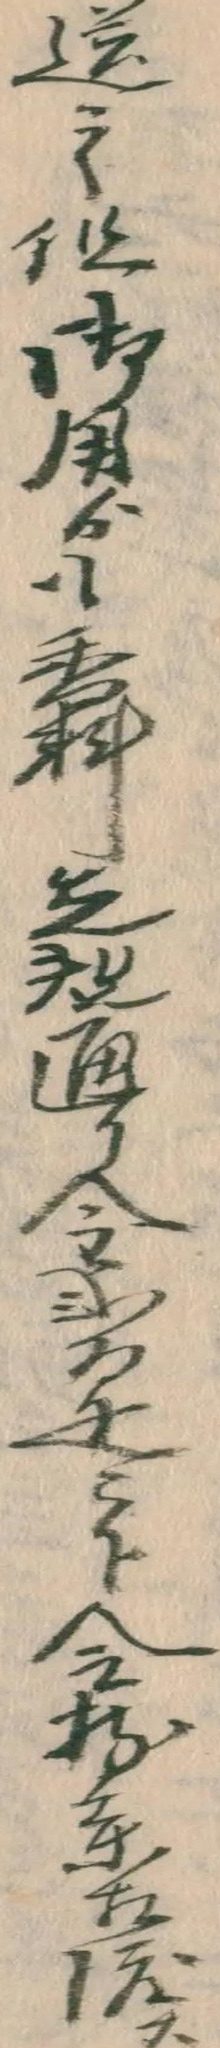送之但御用ゟも香科先規通り金弐百疋被下令持参相渡ス
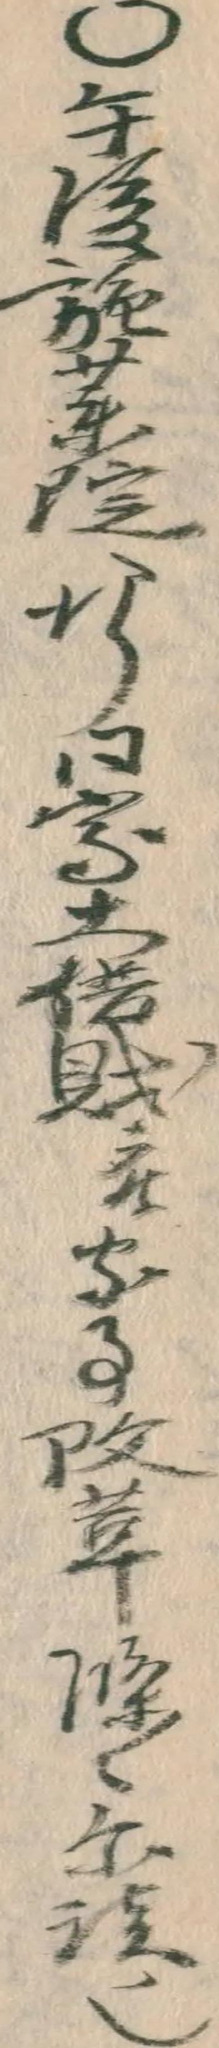○午後施薬院へ行同家大借財ニ付家事改革條々示談也
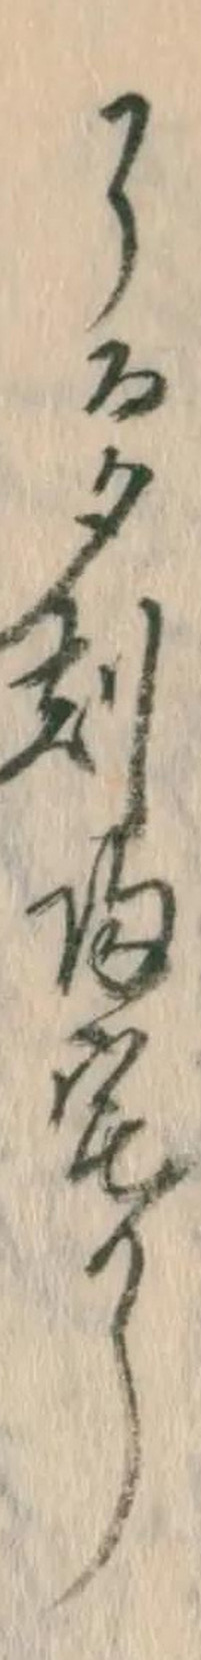了而夕刻帰宅了
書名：賀茂社記録. 第69冊
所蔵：国立国会図書館 National Diet Library, JAPAN
